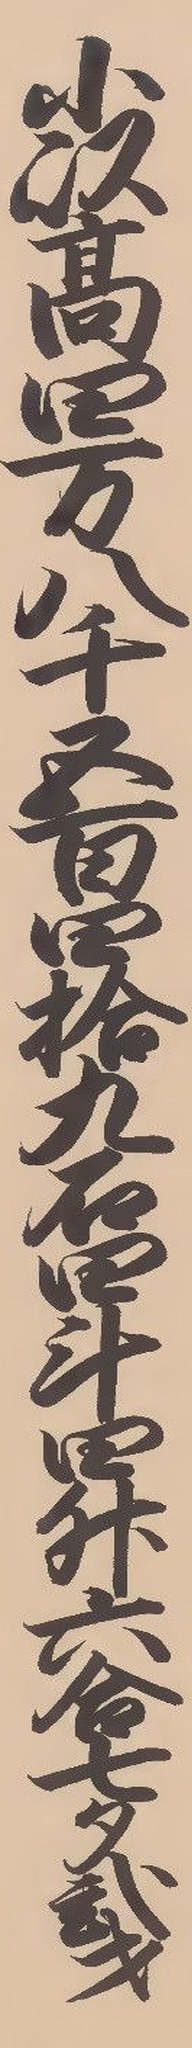小以髙四万八千五百四拾九石四斗四升六合七夕弐才

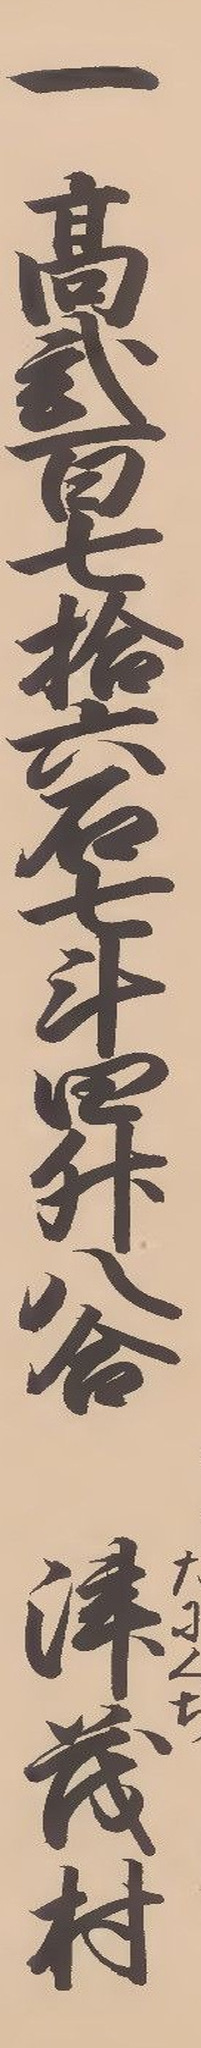一髙弐百七拾六石七斗四升八合津茂村
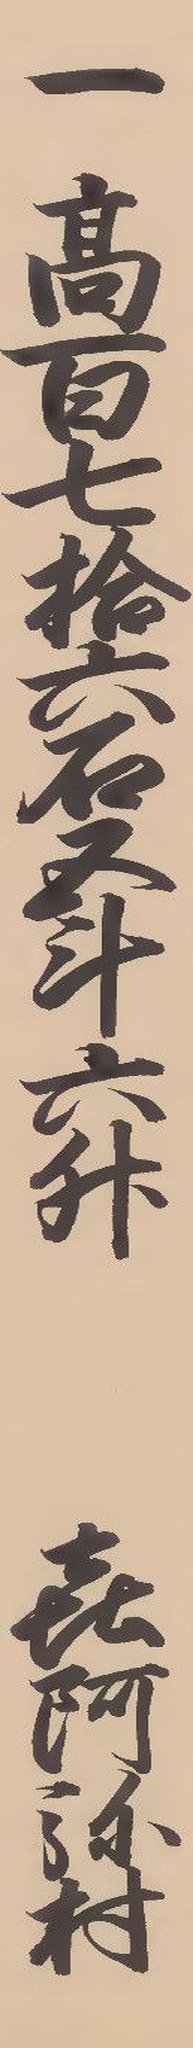一髙百七拾六石五斗六升喜阿弥村
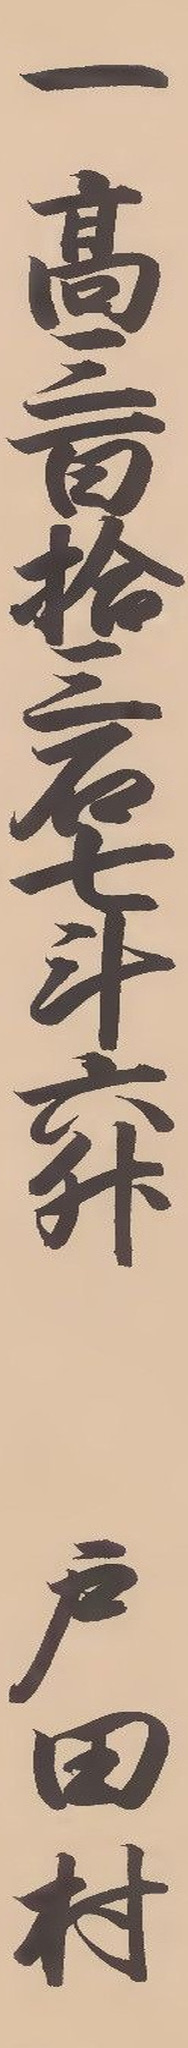一髙三百拾三石七斗六升戸田村
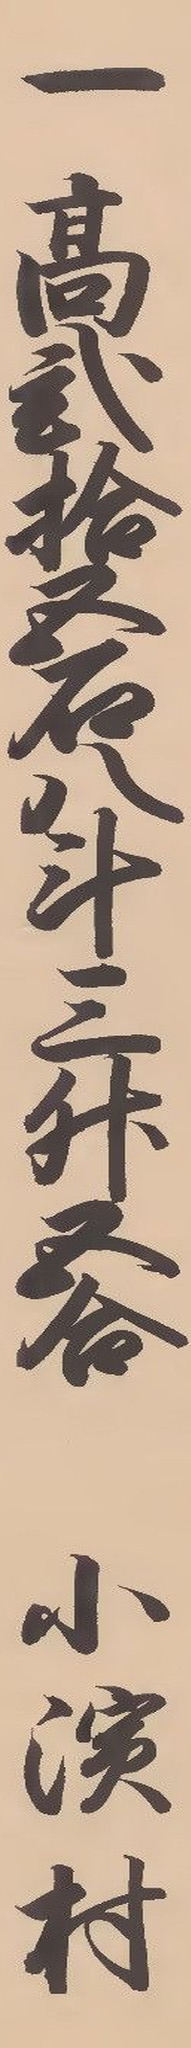一髙弐拾五石八斗三升五合小濱村
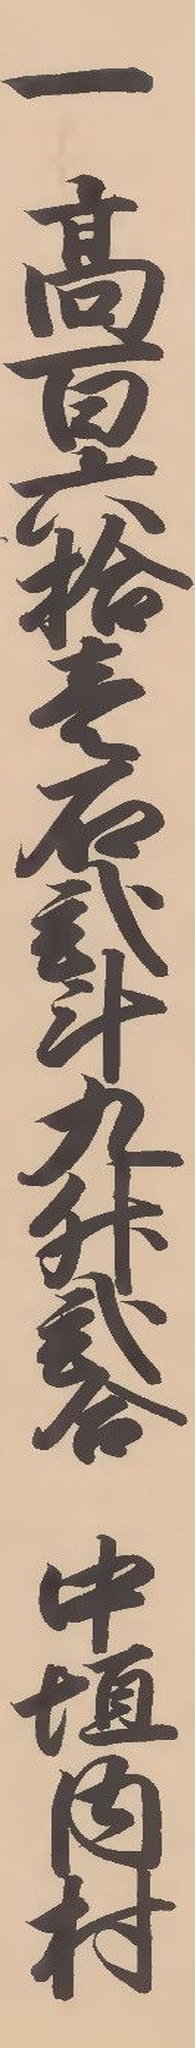一髙百六拾壱石弐斗九升弐合中垣内村
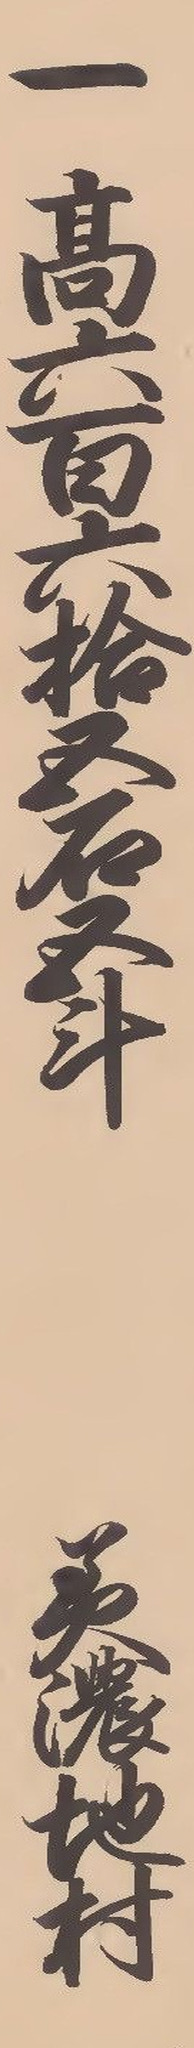一高六百六拾五石五斗美濃地村
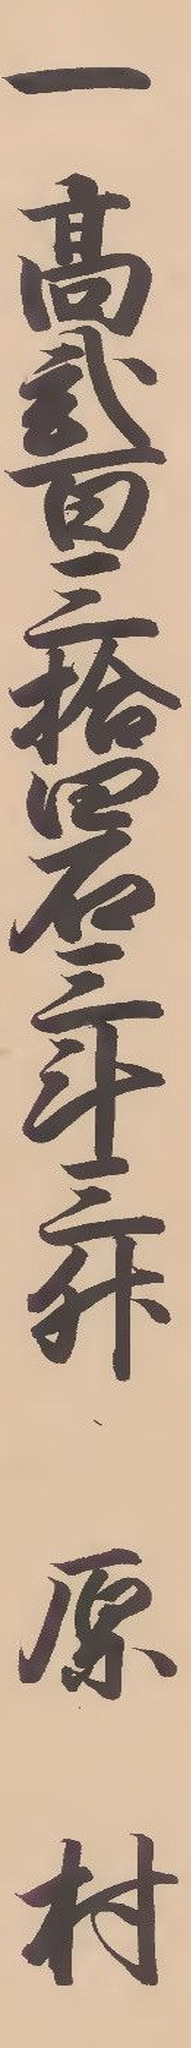一髙弐百三拾四石三斗三升原村

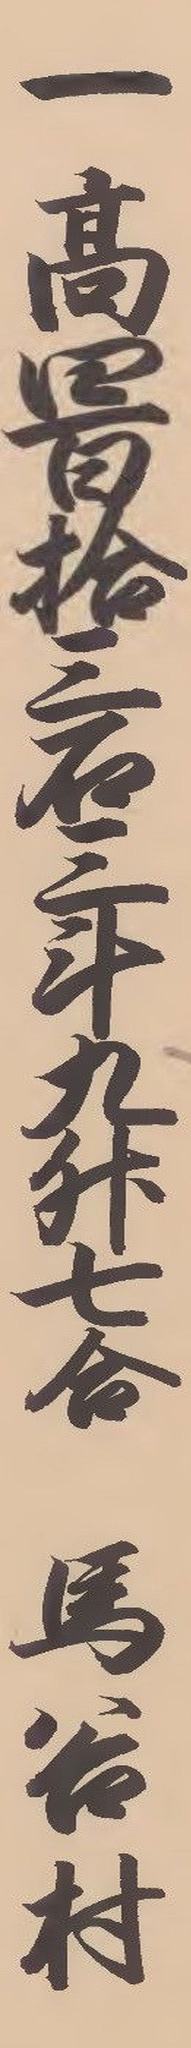一髙四百拾三石三斗九升七合馬谷村
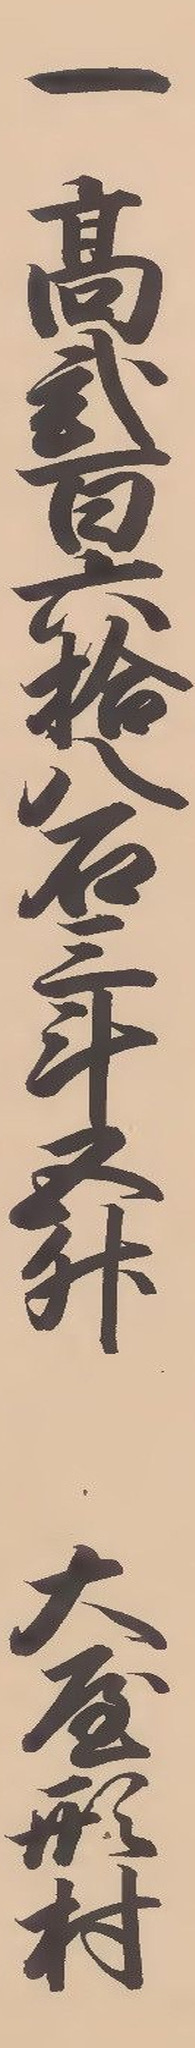一髙弐百六拾八石三斗五升大屋形村
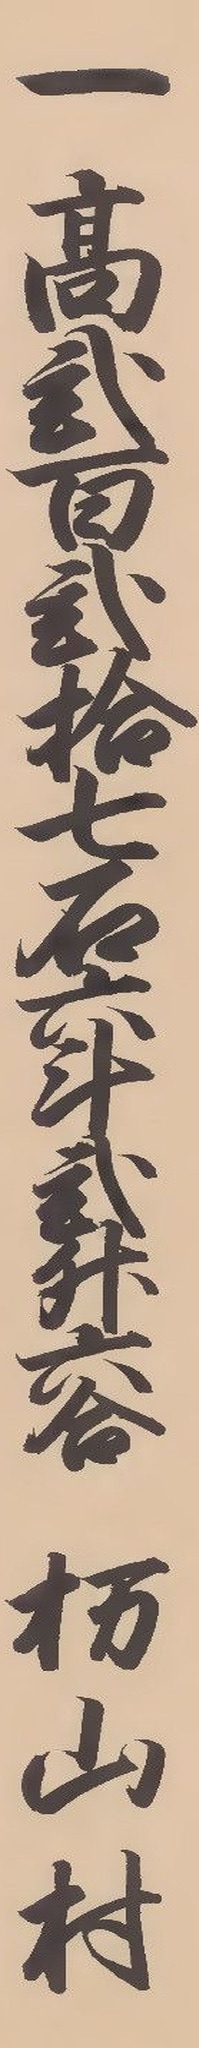一髙弐百弐拾七石六斗弐升六合杤山村
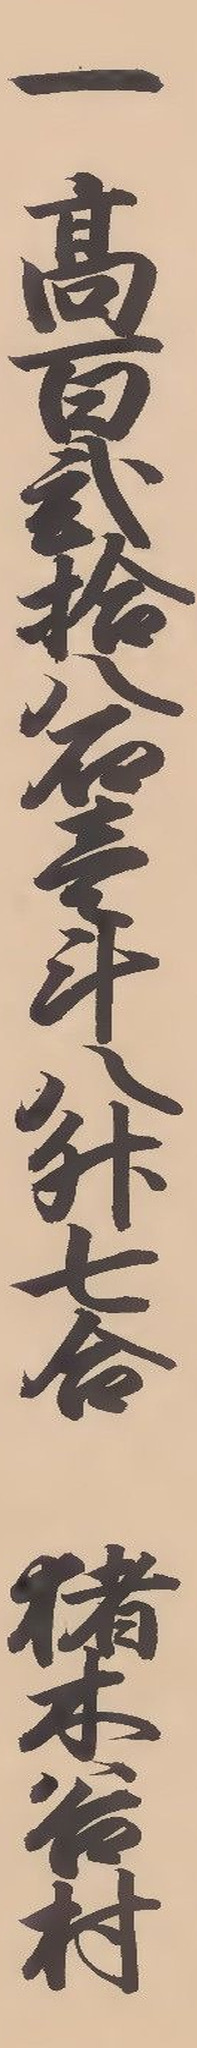一髙百弐拾八石壱斗八升七合猪木谷村
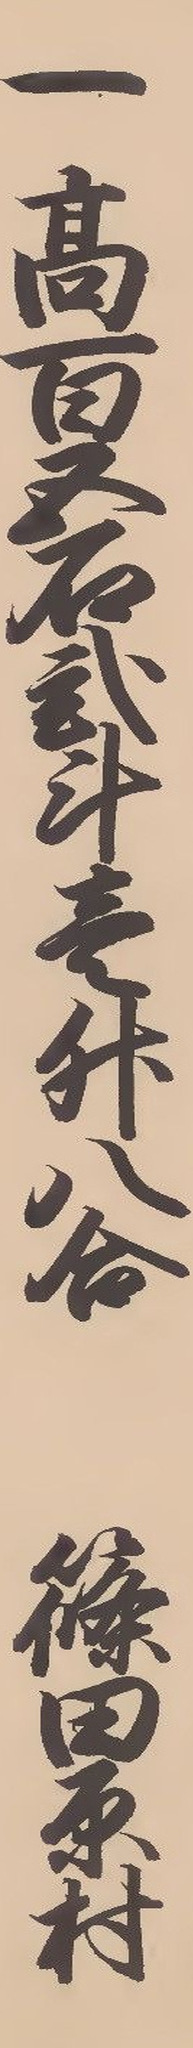一髙百五石弐斗壱升八合篠田原村
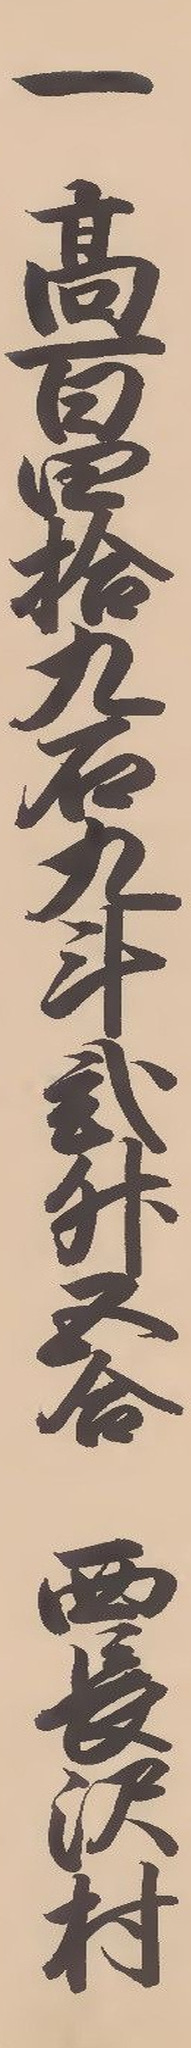一髙百四拾九石九斗弐升五合西長沢村
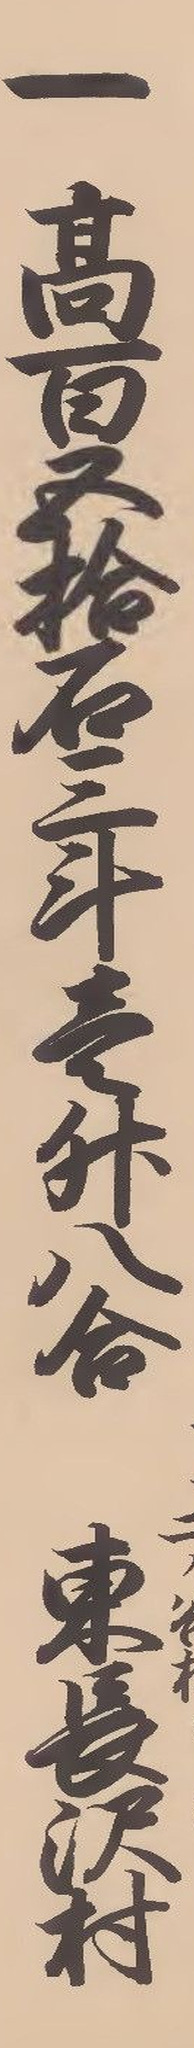一髙百五拾石三斗壱升八合東長沢村
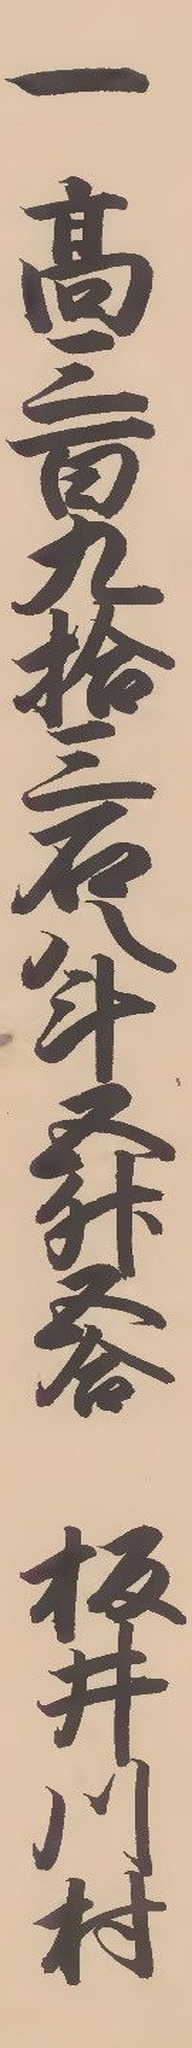一髙三百九拾三石八斗五升五合板井川村
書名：石見国郷帳
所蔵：国立公文書館 National Archives of Japan
